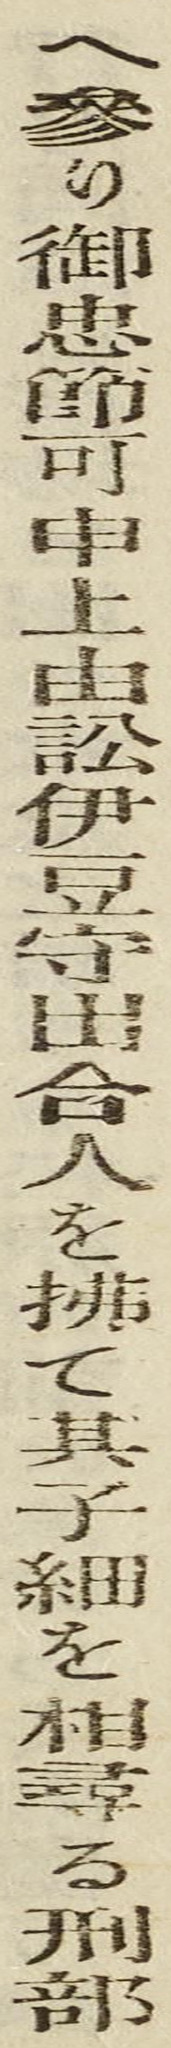へ参り御忠節可申上由訟伊豆守出会人を払て其子細を相尋る刑部
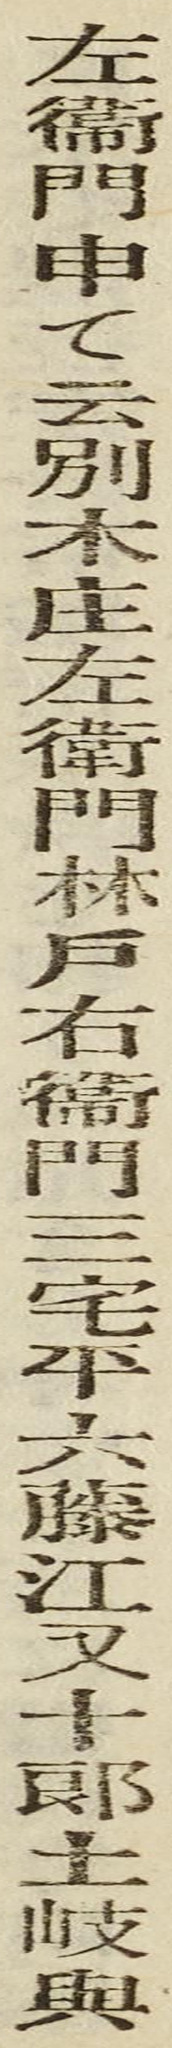左衞門申て云別木庄左衞門林戸右衞門三宅平六藤江又十郎土岐与
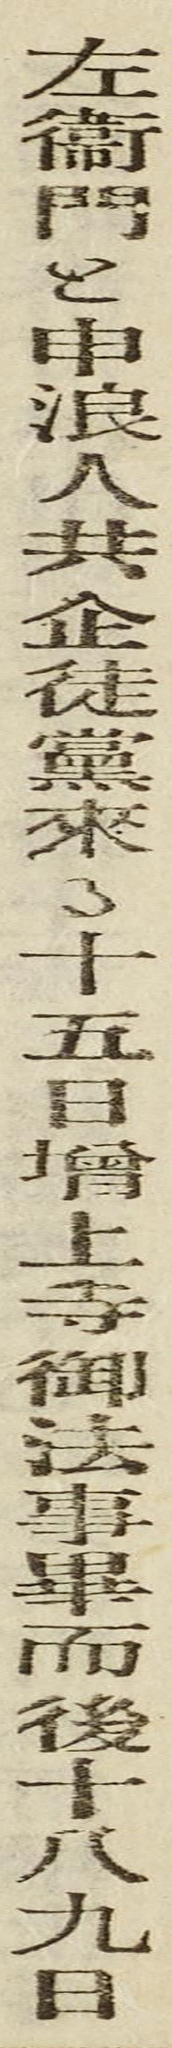左衞門と申浪人共企徒党来る十五日増上寺御法事畢而後十八九日
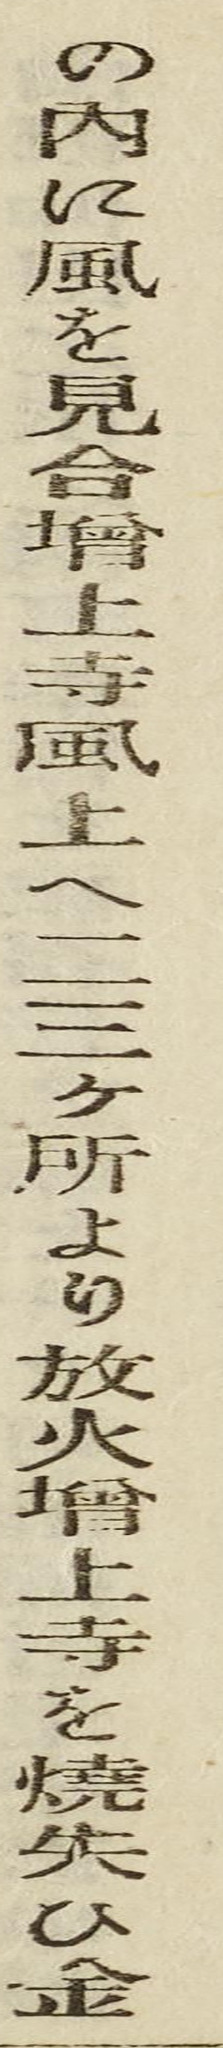の内に風を見合増上寺風上へ二三ケ所より放火増上寺を焼失ひ金
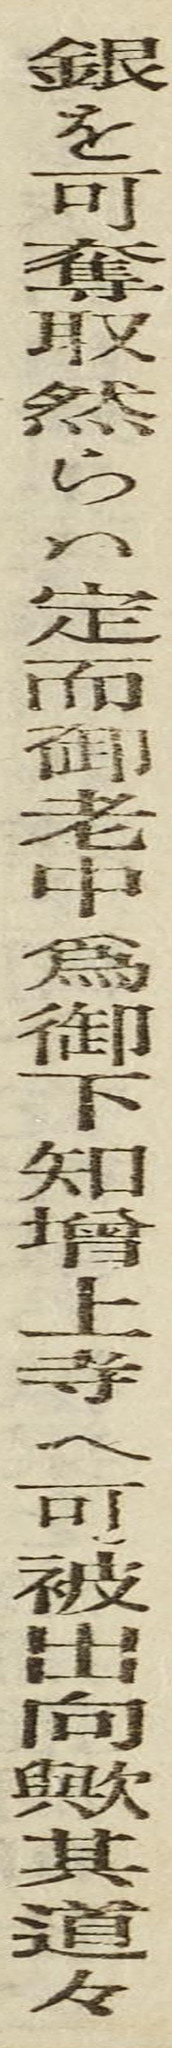銀を可奪取然らは定而御老中為御下知増上寺へ可被出向歟其道々
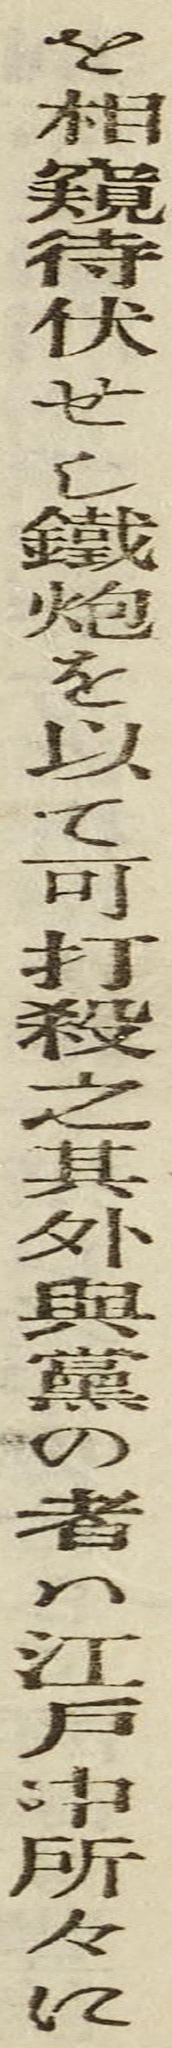を相窺待伏せし鉄炮を以て可打殺之其外与党の者は江戸中所々に
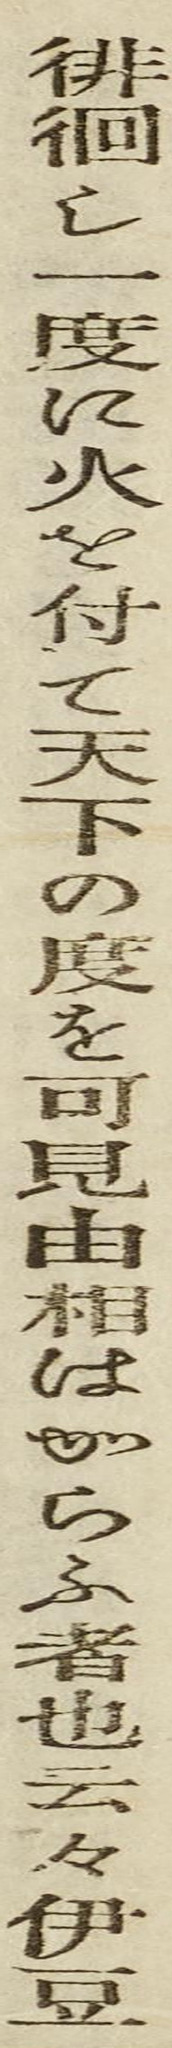徘徊し一度に火を付て天下の度を可見由相はからふ者也云々伊豆
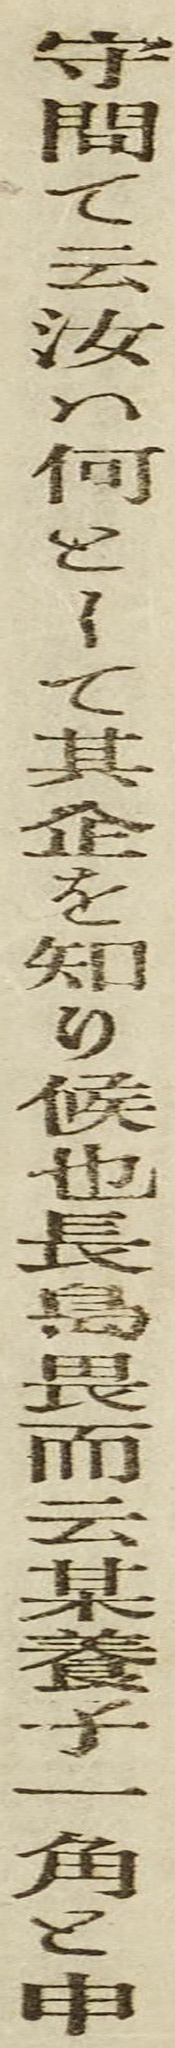守問て云汝は何として其企を知り候也長島畏而云某養子一角と申
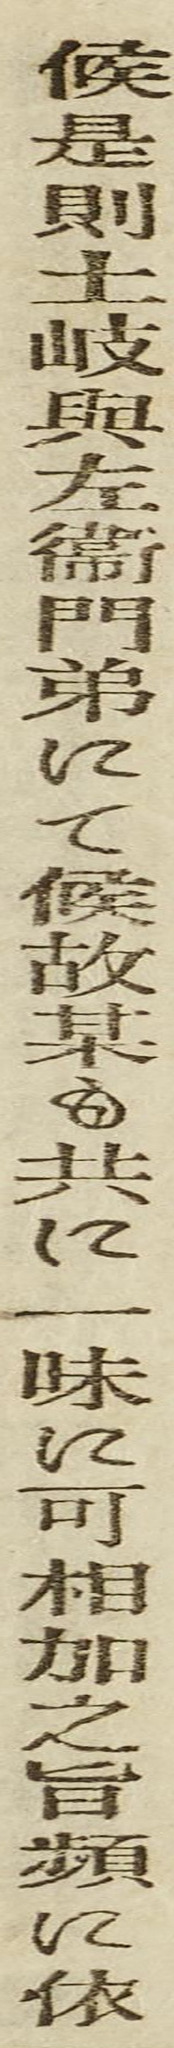候是則土岐与左衞門弟にて候故某も共に一味に可相加之旨頻に依

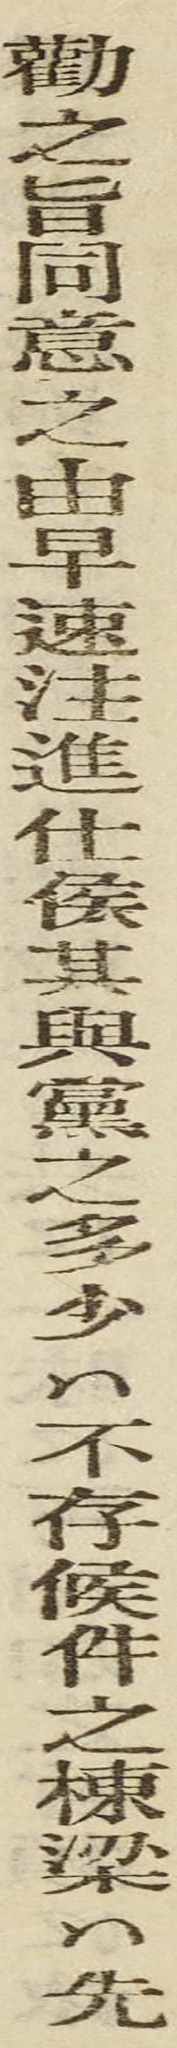勤之旨同意之由早速注進仕候其与党之多少は不存候件之棟梁は先
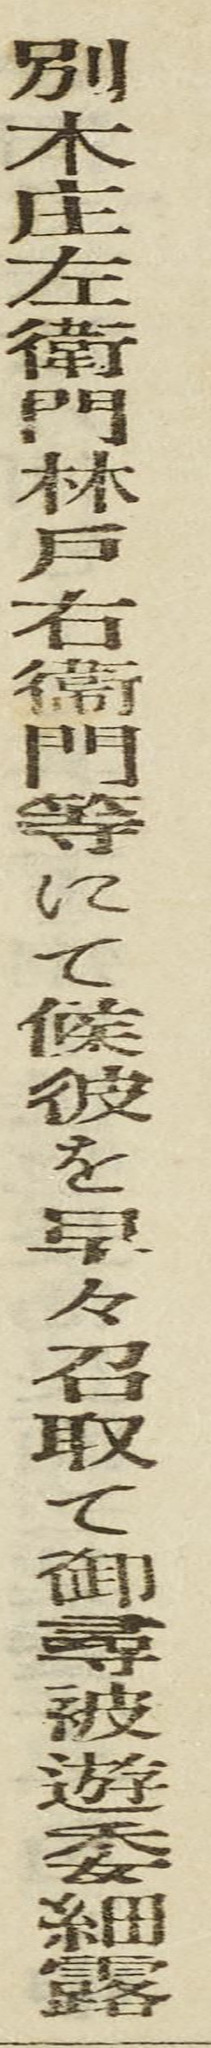別木庄左衞門林戸右衞門等にて候彼を早々召取て御尋被遊委細露
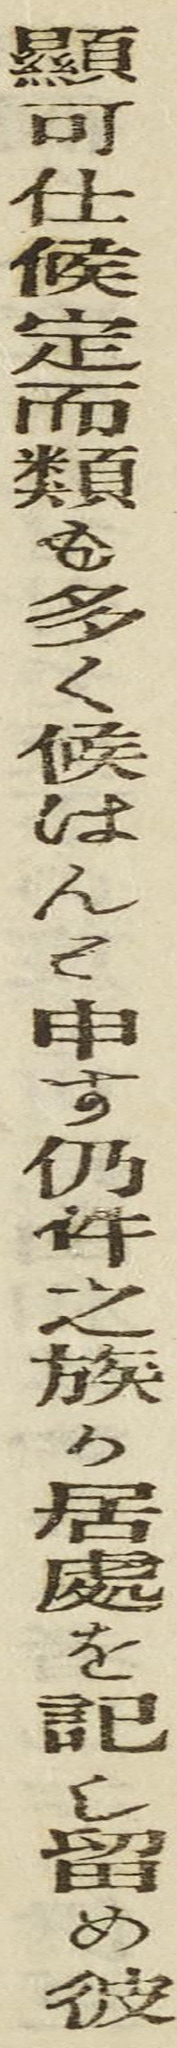顕可仕候定而類も多く候はんと申す仍件之族か居処を記し留め彼
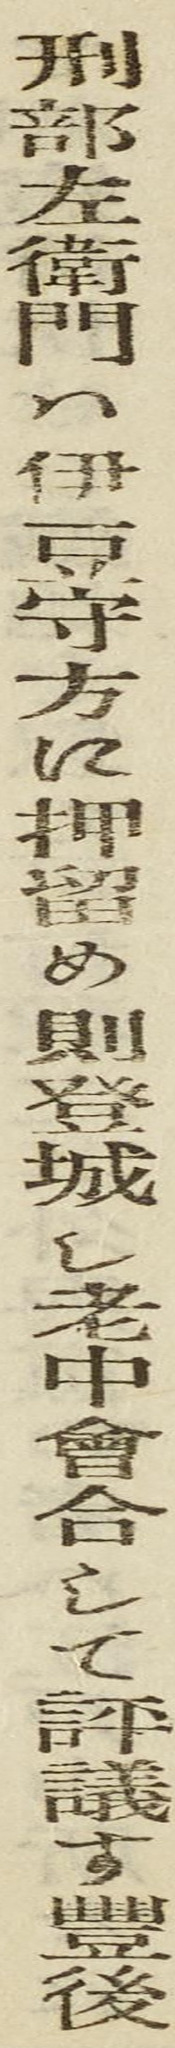刑部左衛門は伊豆守方に押留め則登城し老中会合して評議す豊後
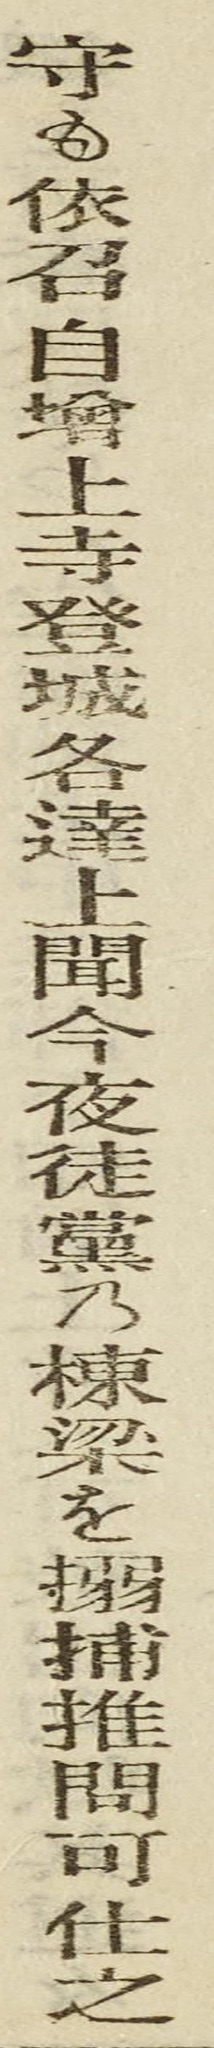守も依召自増上寺登城各達上聞今夜徒党の棟梁を搦捕推問可仕之
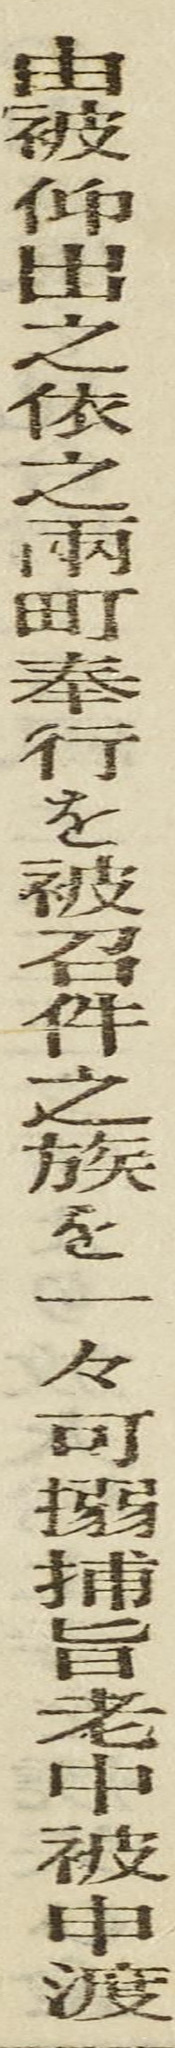由候仰出之依之両町奉行を被召件之族を一々可搦捕旨老中被申渡
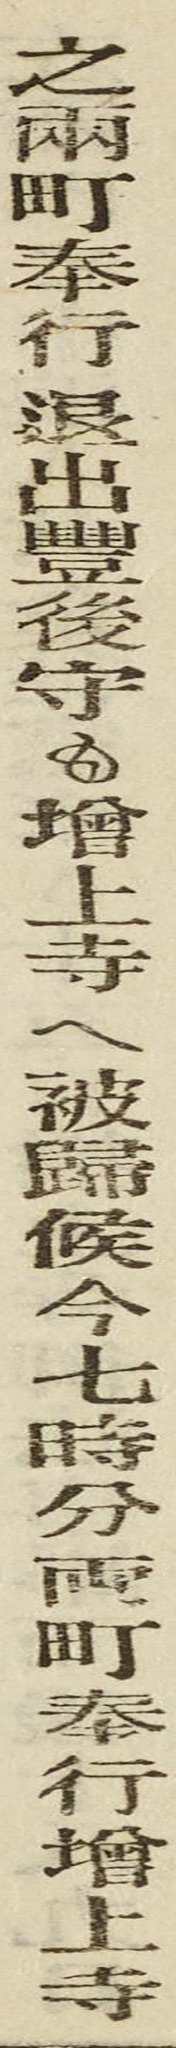之両町奉行退出豊後守も増上寺へ被帰候今七時分両町奉行増上寺
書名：史籍集覽　朝鮮陣古文・細井廣澤記・颶風紀事・天明七年將軍宣下次第書　全
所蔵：東京大学地震研究所図書室 Earthquake Research Institute Library, The University of Tokyo, JAPAN
